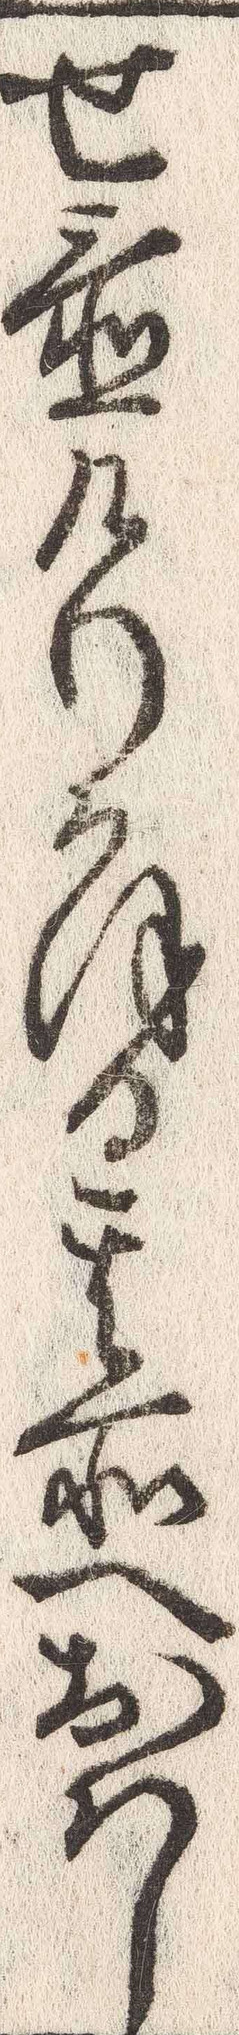せ置けりかほる其所へおはし
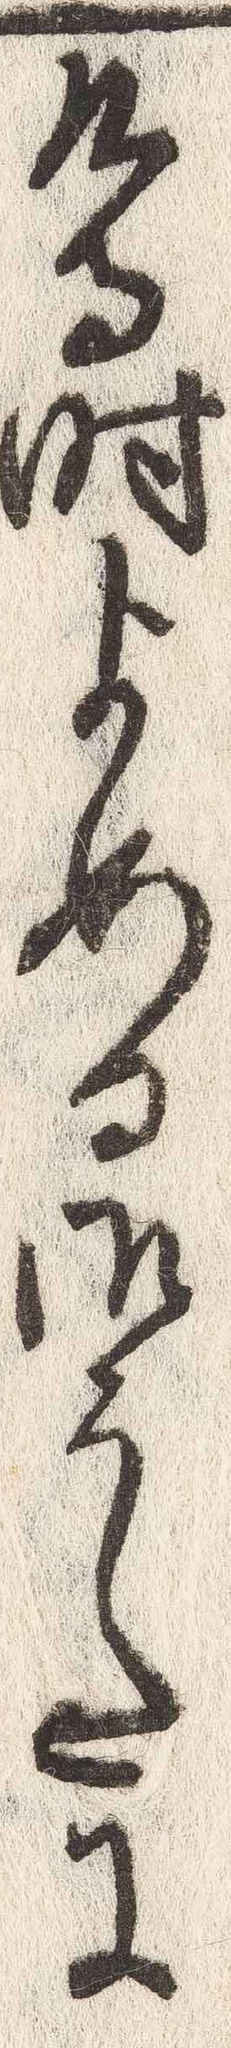ける時よめる御うたに
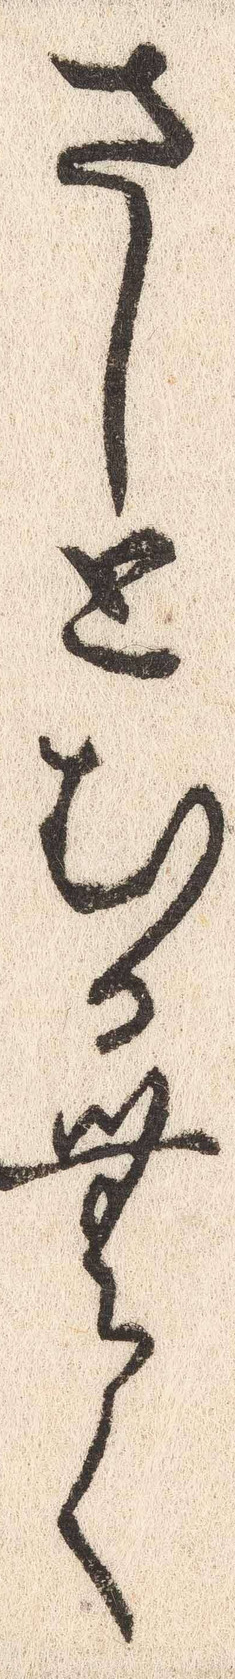さしとむるむく
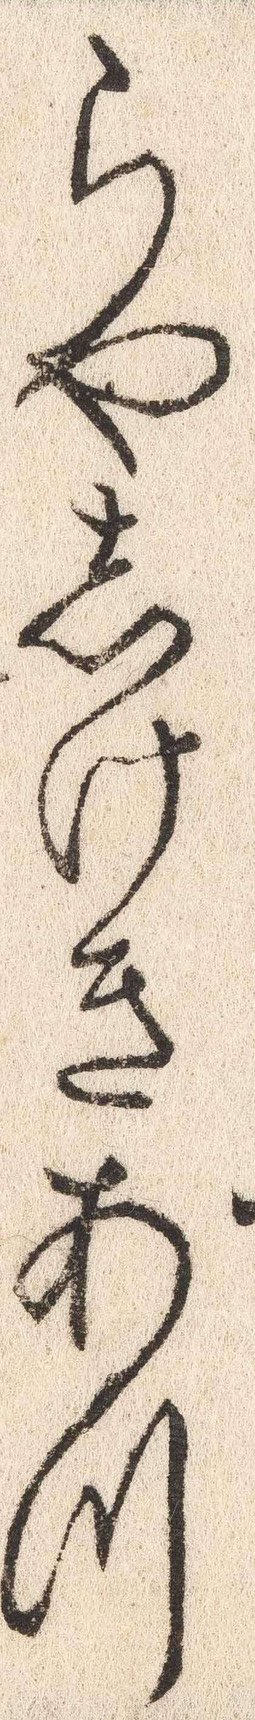らやしけきあつ
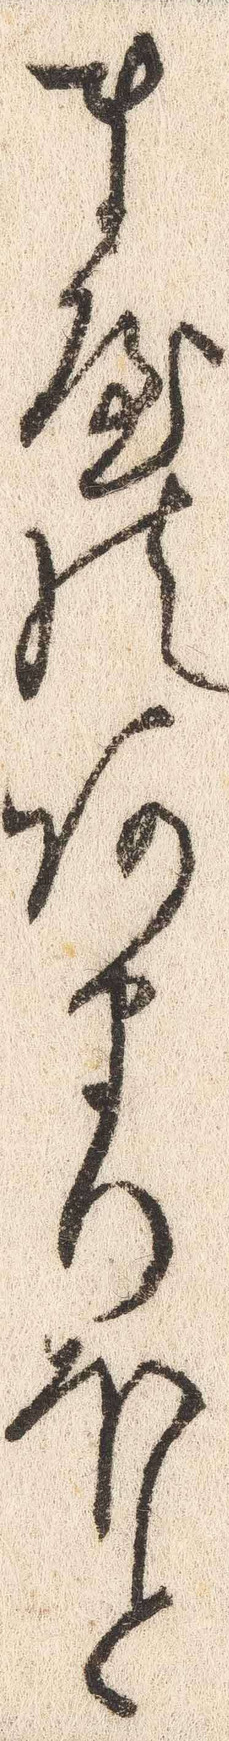ま屋のあまりほと
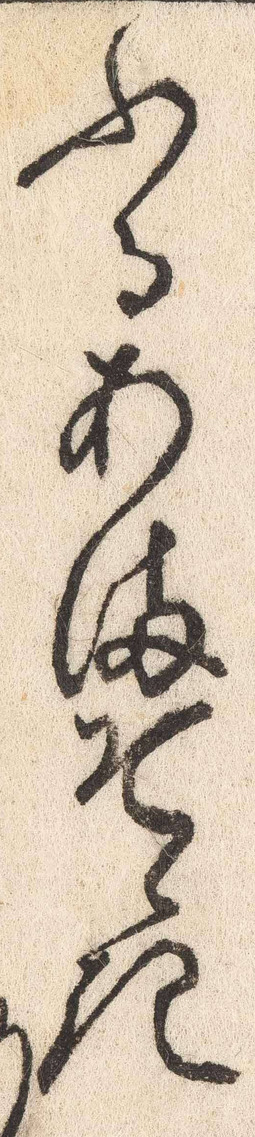ふるあまそゝき

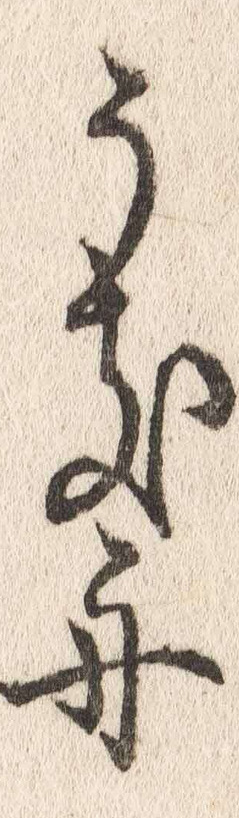うき舟
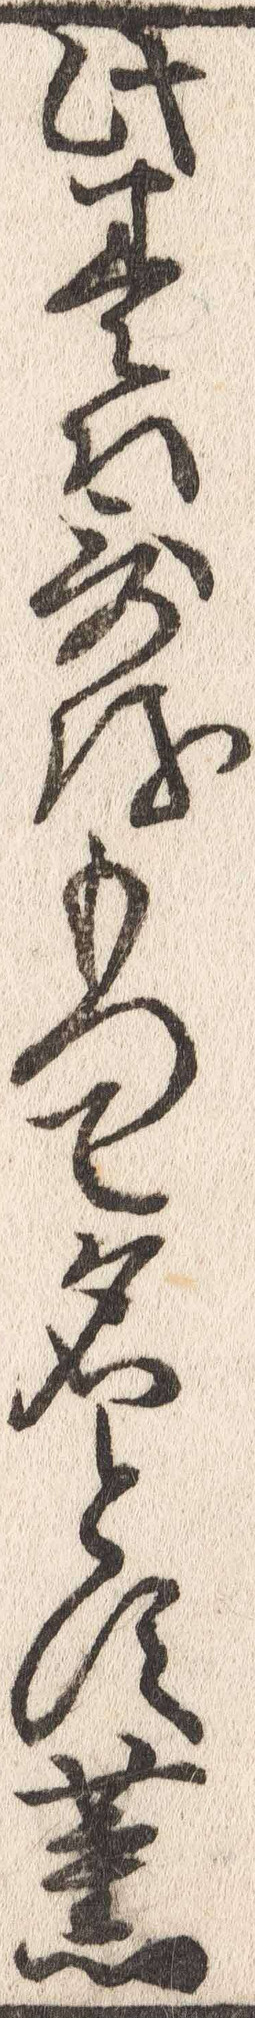此巻は哥をもつて名とす薫
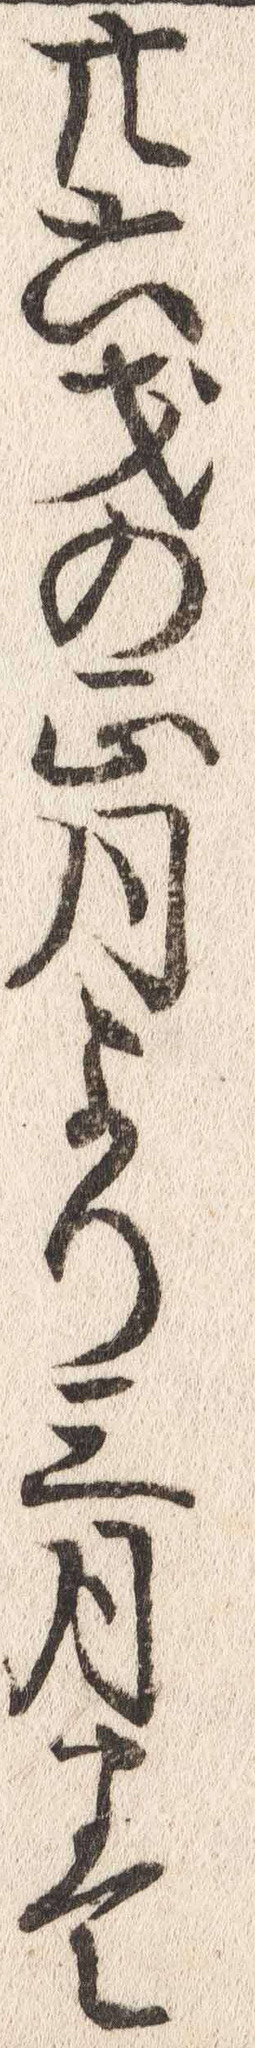二六才の正月より三月まて
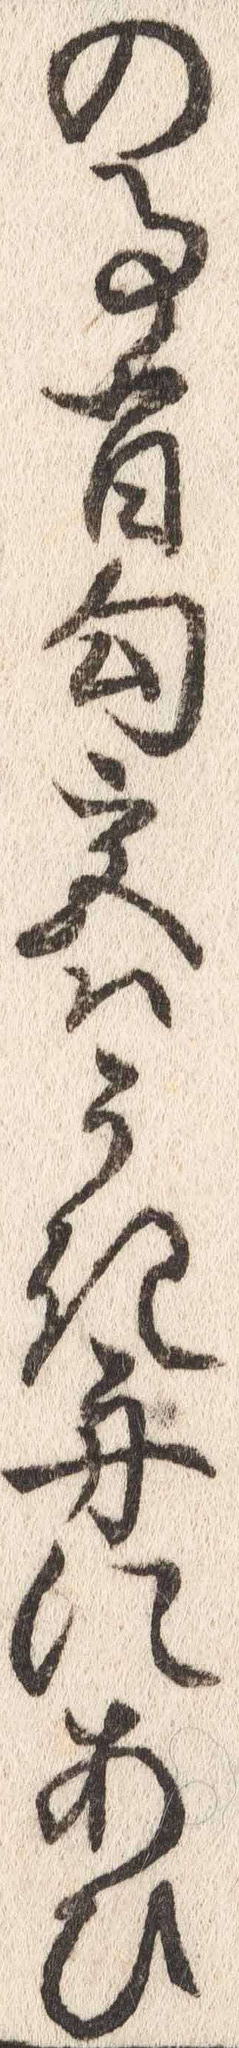の事有匂宮はうき舟にあひ
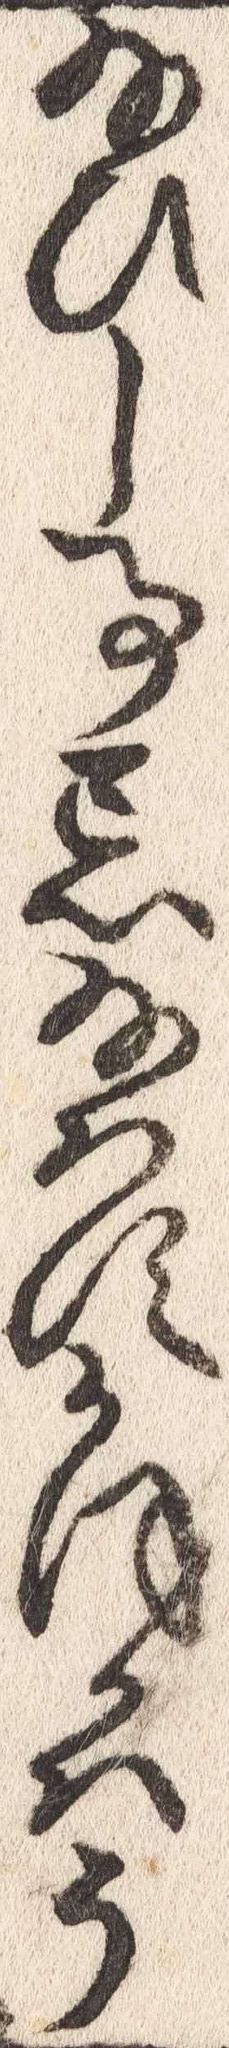給ひし事忘給はすかほるはう
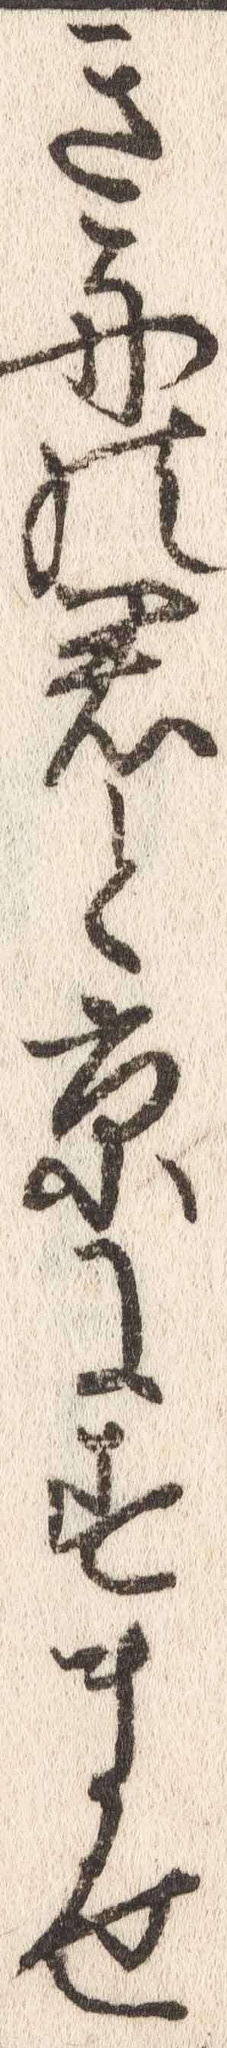き舟の君と京にすませ
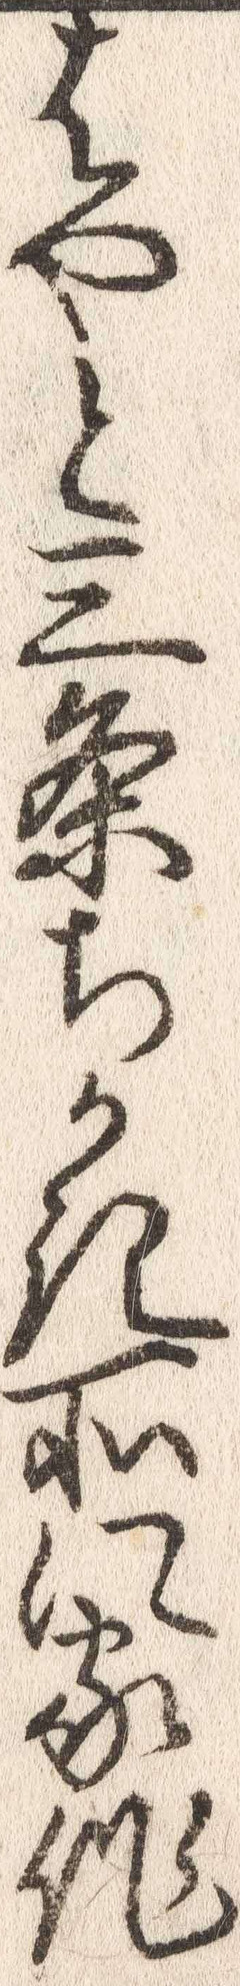はやと三条ちかき所に家作
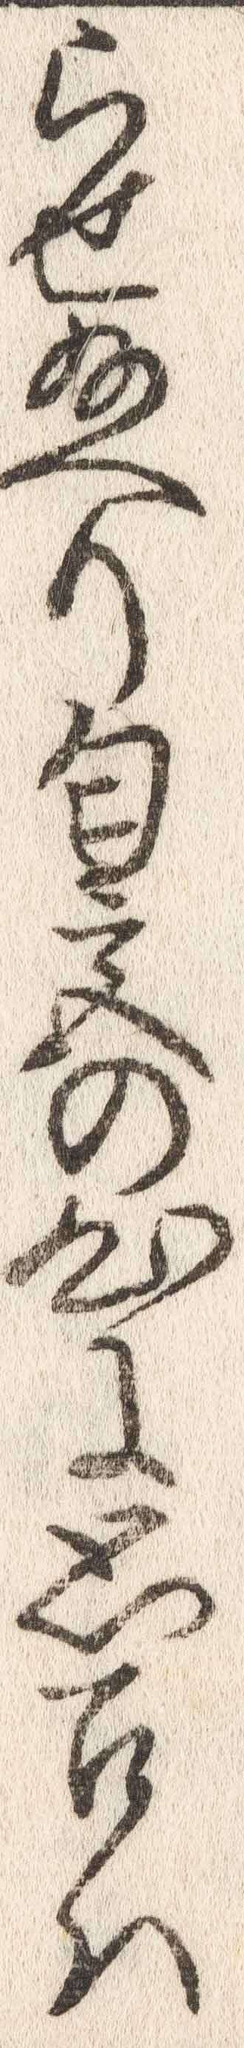らせ給へり匂宮の心に思召は
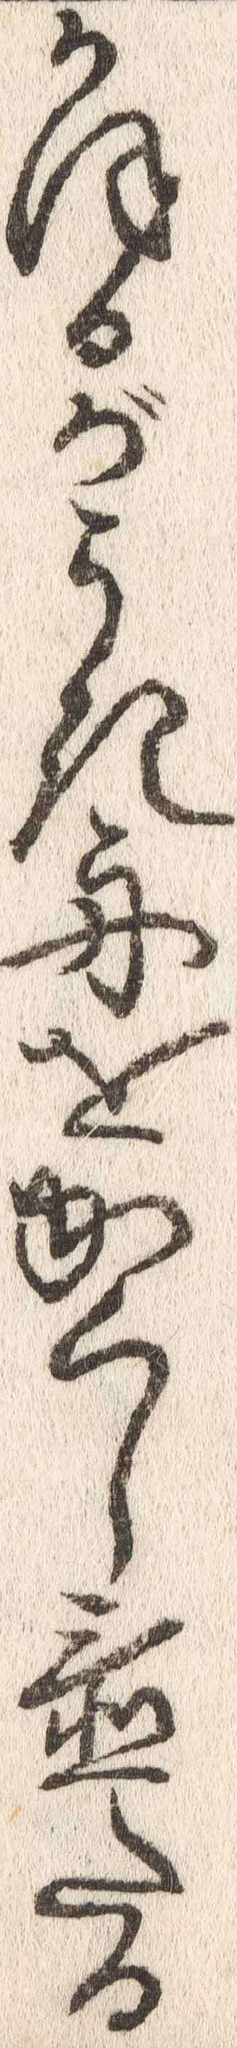かほるがうき舟をかくし置たる
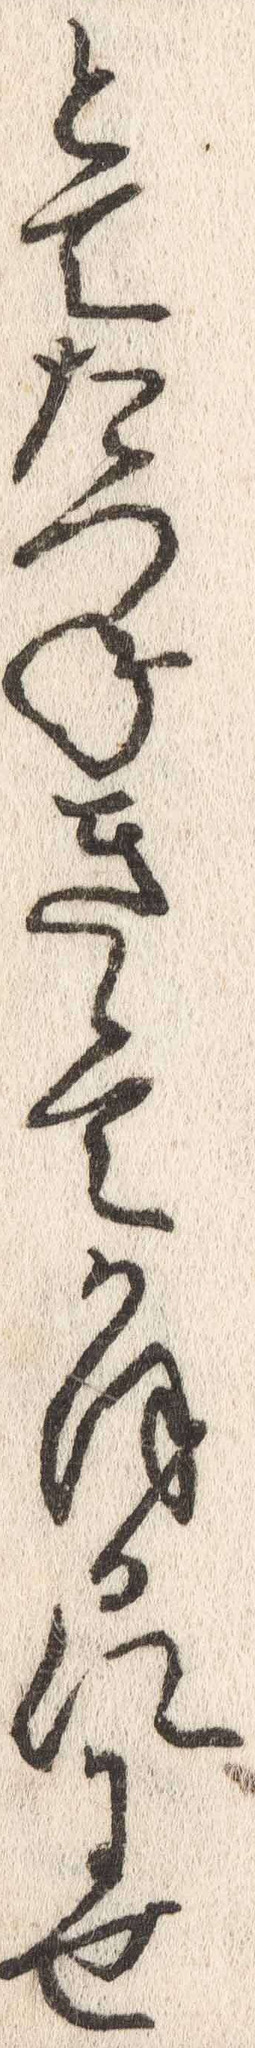とてたつねきゝてかほるににせ
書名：源氏物語
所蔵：東京学芸大学附属図書館 国文学研究資料館
